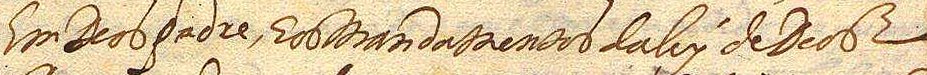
Em Deos padre, E os mandamentos da ley de Deos
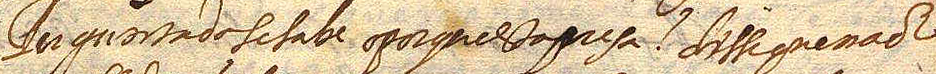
Perguntado se sabe o porque esta presa? disse que naõ
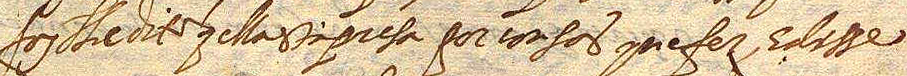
foy lhe dito q̄ ella esta presa por cousas que fez, E disse
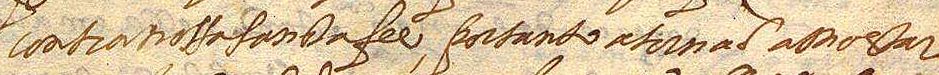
contra nossa sancta fee, portanto a tornaõ amoestar
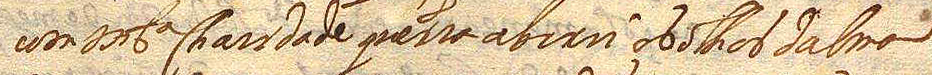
com mta Charidade queira abrirr os olhos dalma
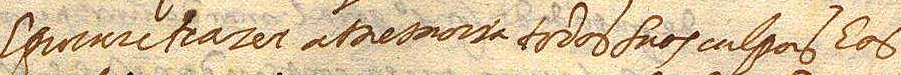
E procure trazer a memoria todas suas culpas E as
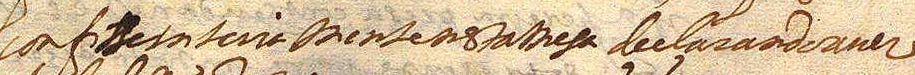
confesse inteiramente nesta mesa declarando a uer
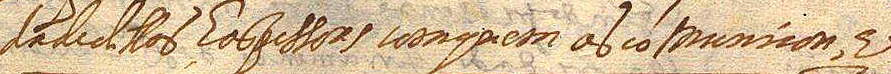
dade dellas, E as pessoas com quem as cōmunicou, E
